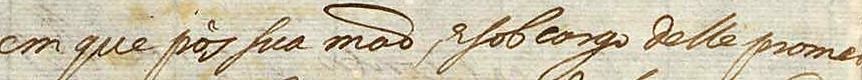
em que pôs sua mão, e sob cargo delle prome
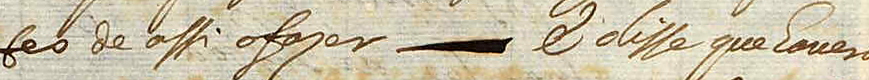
teo de assi o fazer — e disse que havera
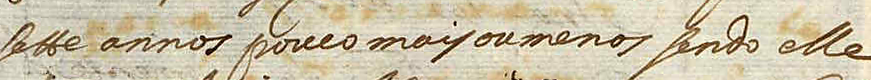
sette annos pouco mais ou menos sendo elle
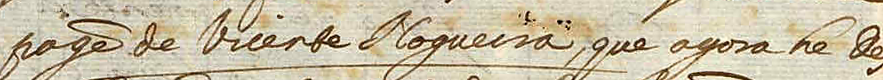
pagē de Vicente Nogueira, que agora he De
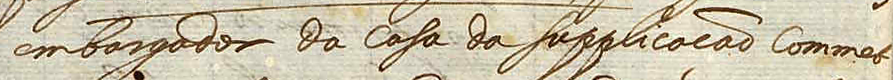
embargador da Casa da Supplicação commet
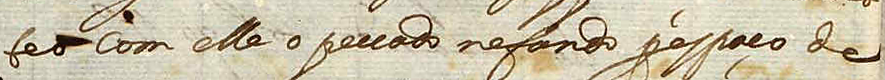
teo com elle o peccado nefando o perpaço de
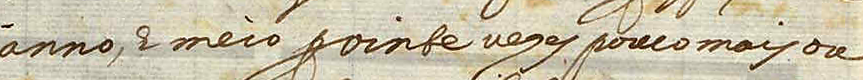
anno, e meio p̄ vinte vezes pouco mais ou
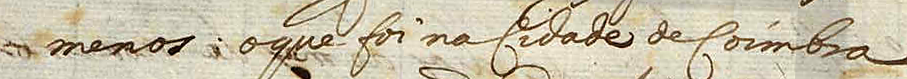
menos; o que foi na Cidade de Coimbra
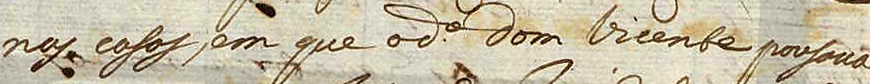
nas Casas, em que o d.o dom Vicente pousava
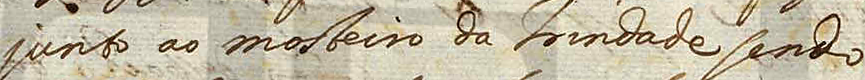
junto ao mosteiro da Trindade, sendo
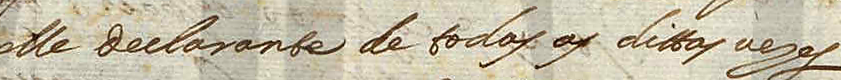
elle declarante de todas as dittas vezes
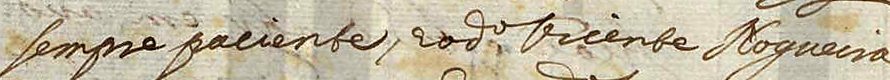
sempre paciente, e o d.o Vicente Nogueira
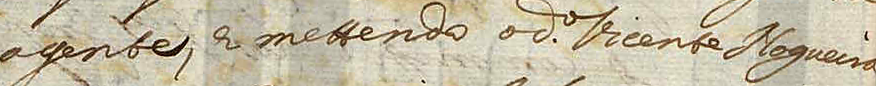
agente, e mettendo o d.o Vicente Nogueira
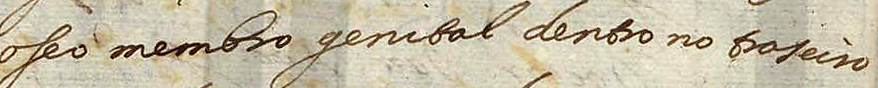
o seo membro genital dentro no traseiro
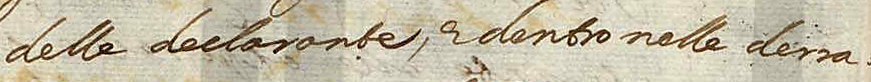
delle declarante, e dentro nelle derra-
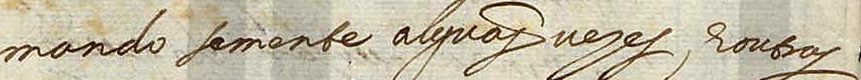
mando semente alguās vezes, e outras
